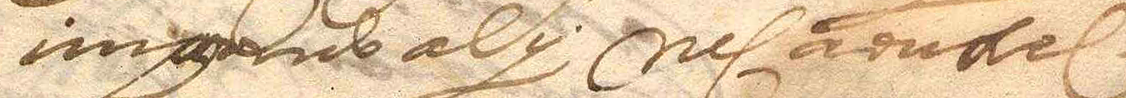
impondo a sy nē a outrē
